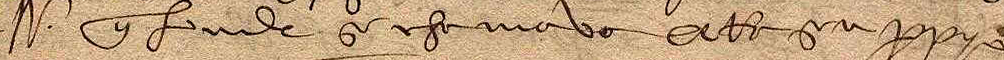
.ss. q̄ honde se chamava e eRa seu ꝓpyo
